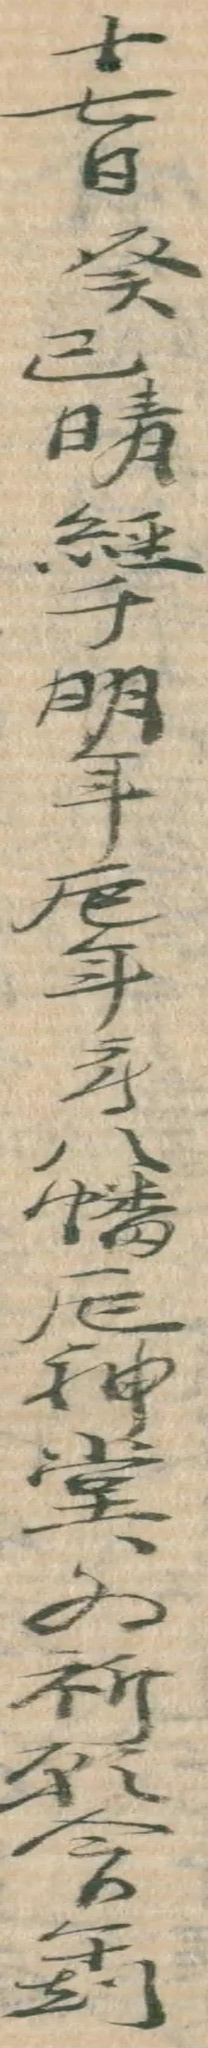十七日癸巳晴経千明年厄年ニ付八幡厄神堂ヘ為祈願今日午刻
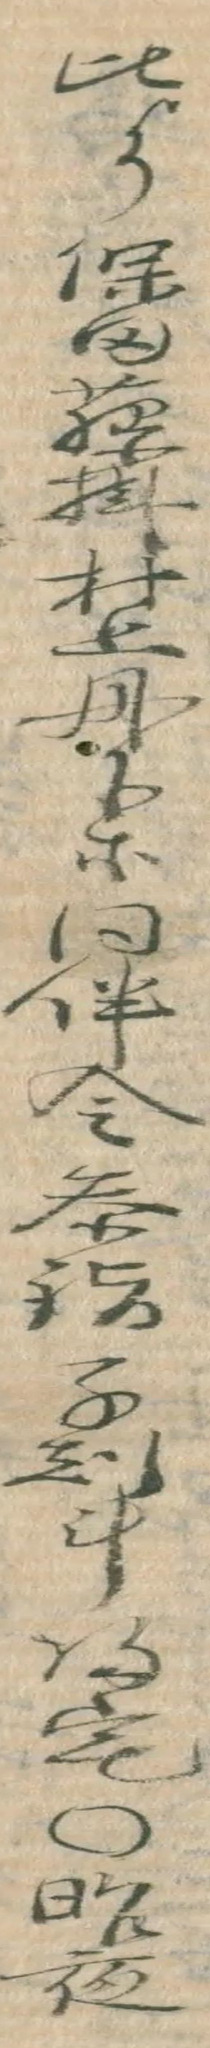比より保田蘇掛村上丹下等同伴令参詣子刻斗帰宅○昨夜
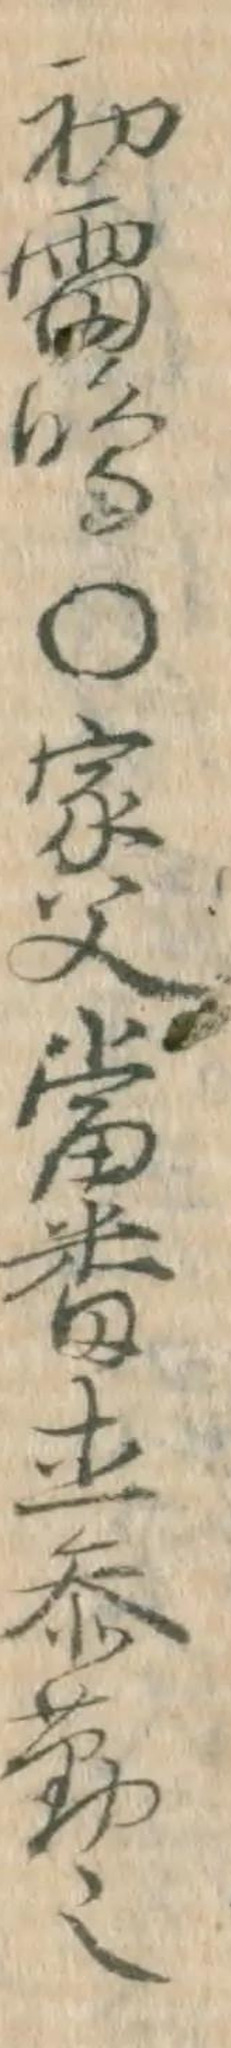初雷鳴○家父當番直参勤也
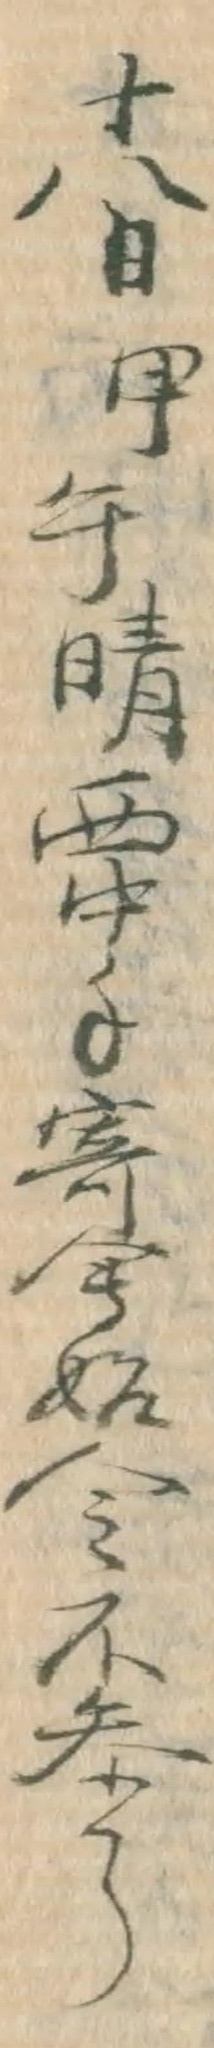十八日甲午晴西中手寄舎始令不参了

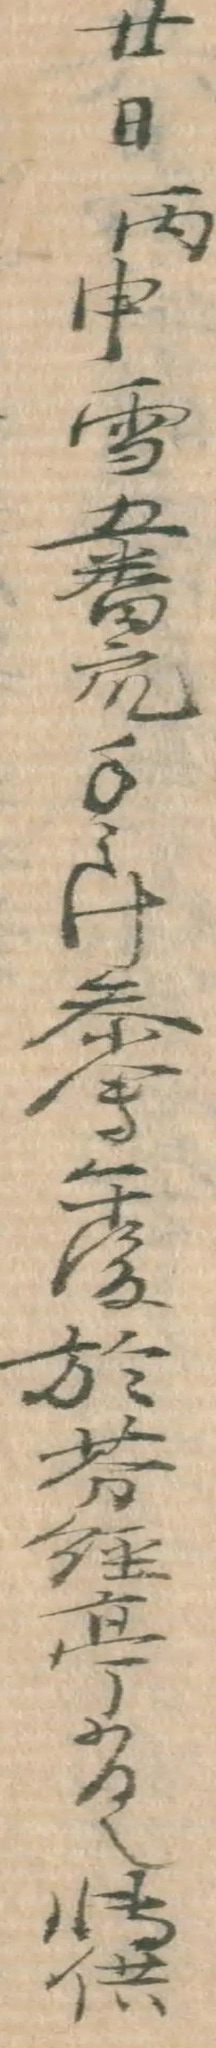廿日丙申雪五番衆手之汁参會午後於芬経亭有之轉供
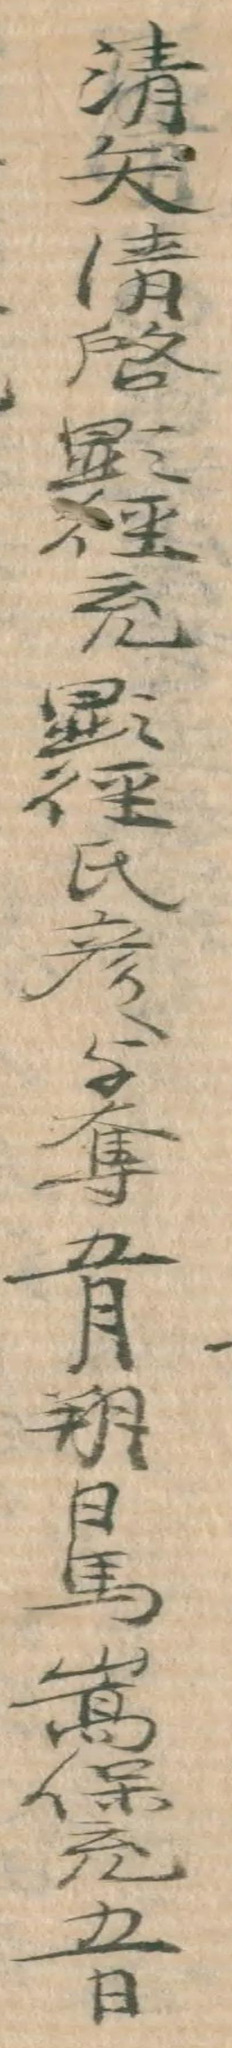清矢清啓顕径充顕径氏彦与奪五月朔日馬嵩保充五日
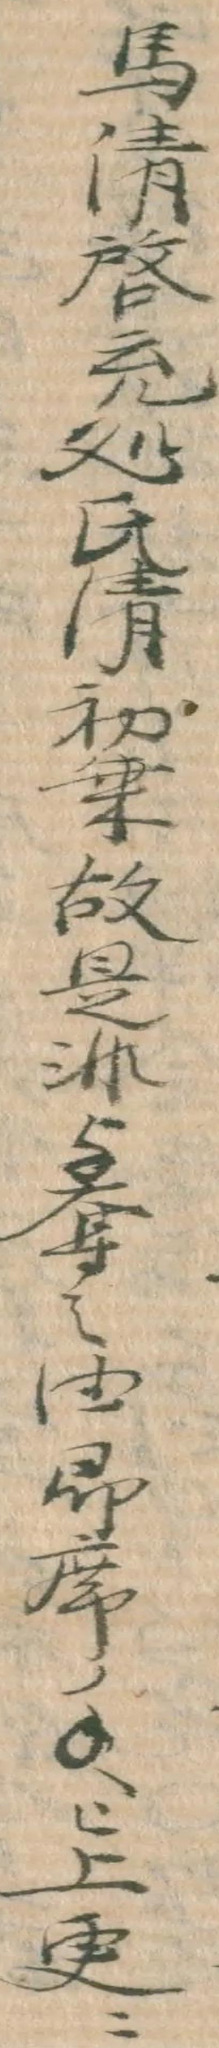馬清啓充処氏清初乗故是非与奪之由即席ノ手へ被上更ニ
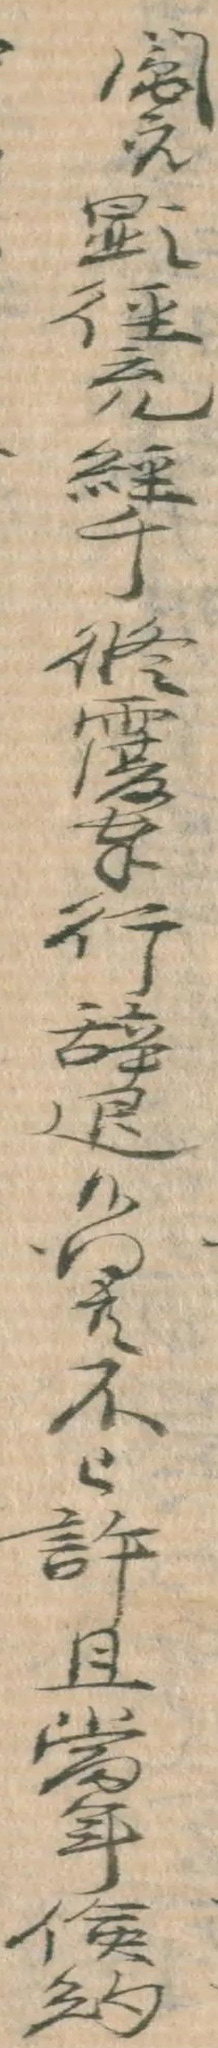鬮取顕径充経千修覆奉行辞退候得共不被許且當年倹約
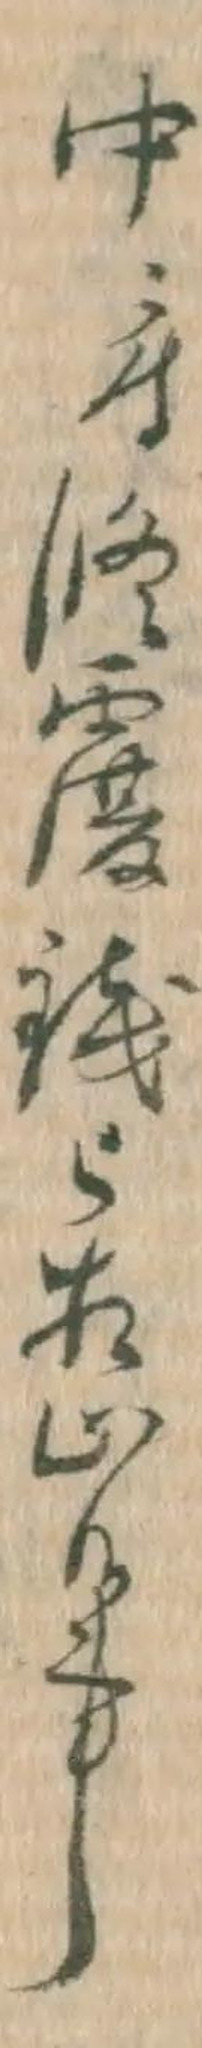中ニ付修覆銭被相止候事
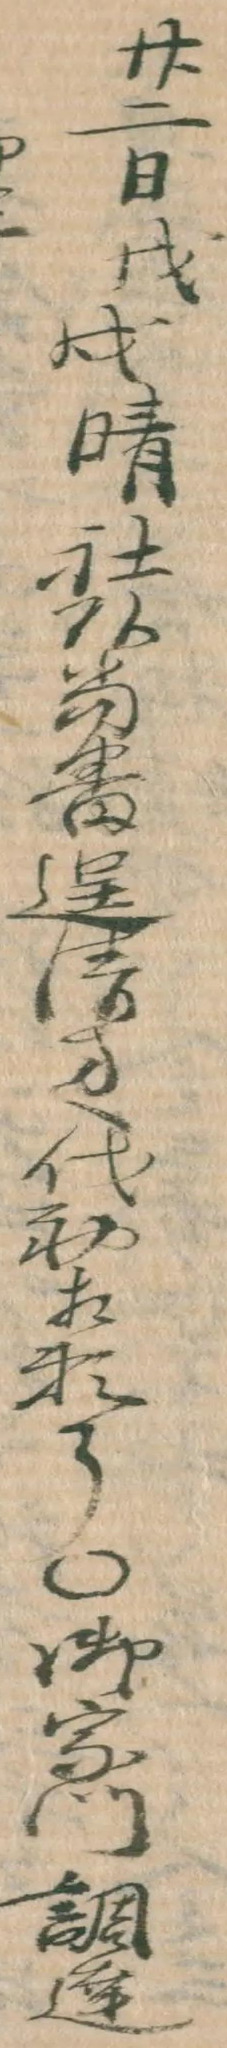廿二日戊戌晴社頭當番逞清方へ代勤相頼了○御家門調達
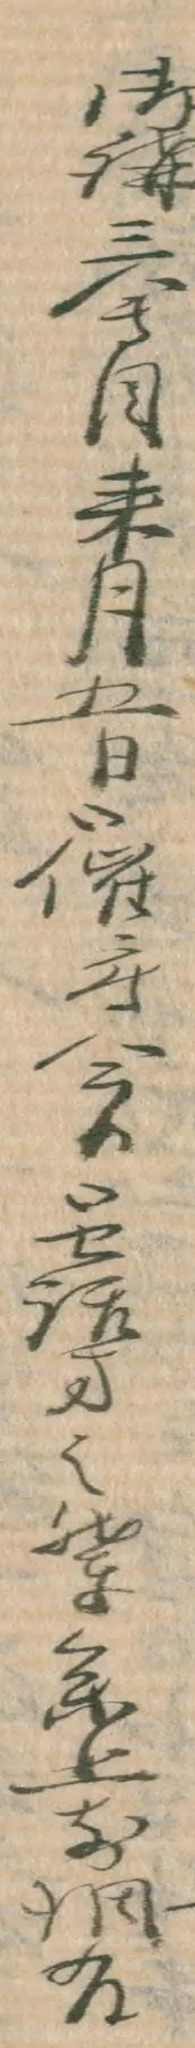御講三會自来月五日御催ニ付今日御世話方之輩参上前調有
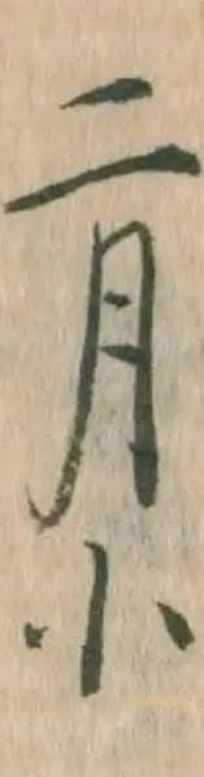二月小
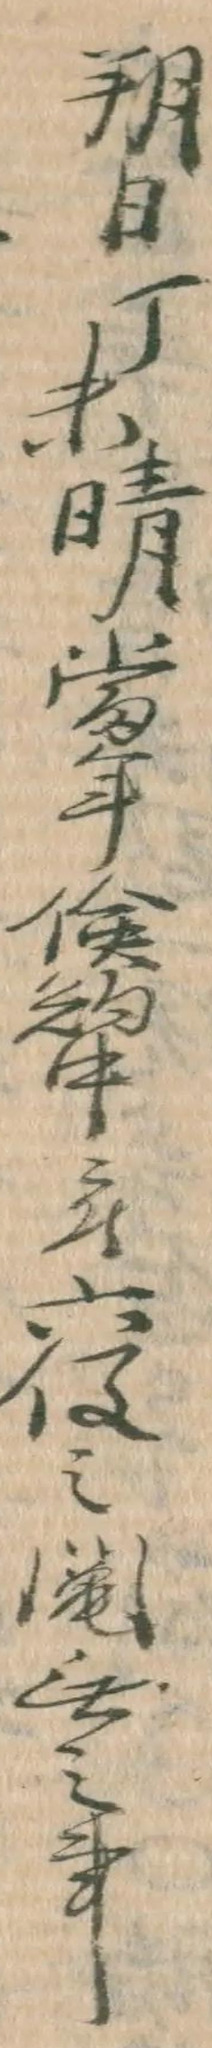朔日丁未晴當年倹約中ニ付六役之鬮無之事
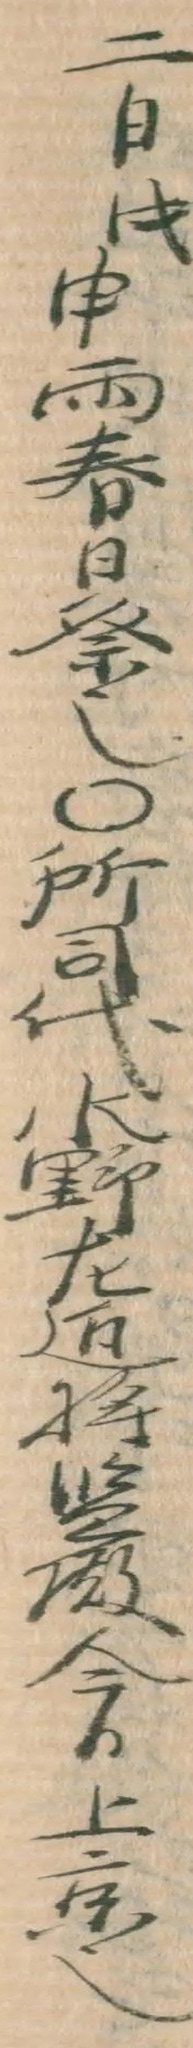二日戊申雨春日祭也○所司代水野左近将監殿今日上京也
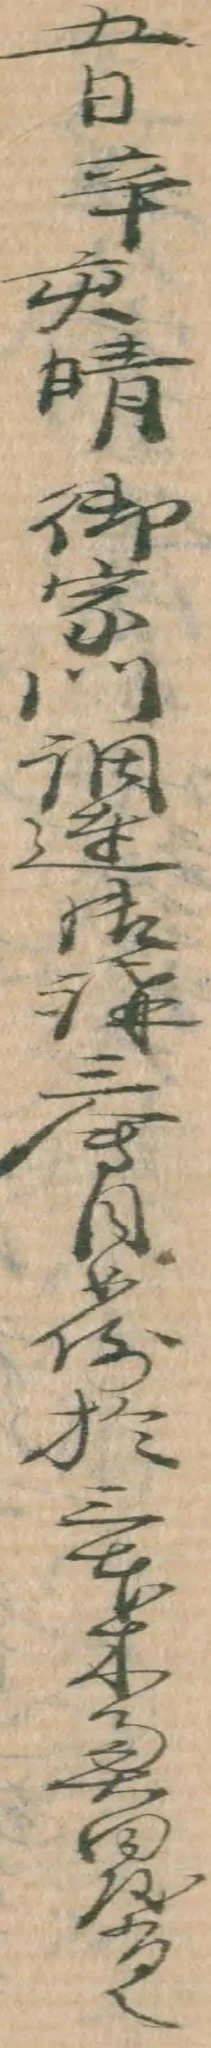五日辛亥晴御家門調達御講三會目如例於三本木奥田屋有之
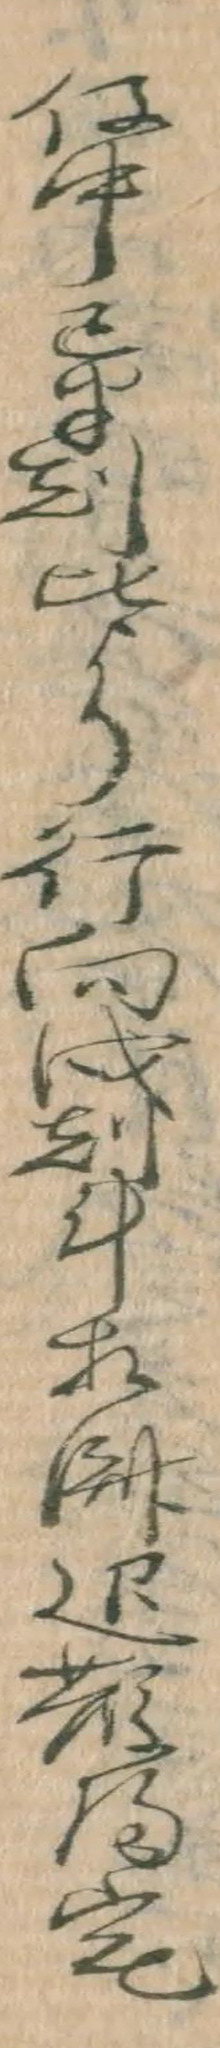備中巳半刻比より行向戌刻斗相済退散帰宅
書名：賀茂社記録. 第65冊
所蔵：国立国会図書館 National Diet Library, JAPAN
